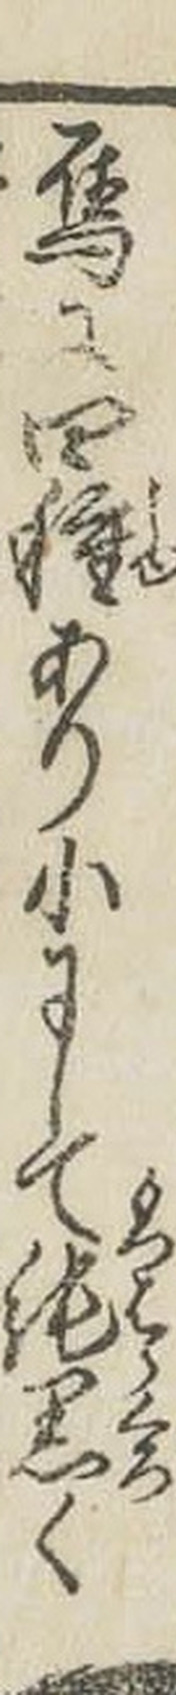鷹に四種あり小にして純黒く
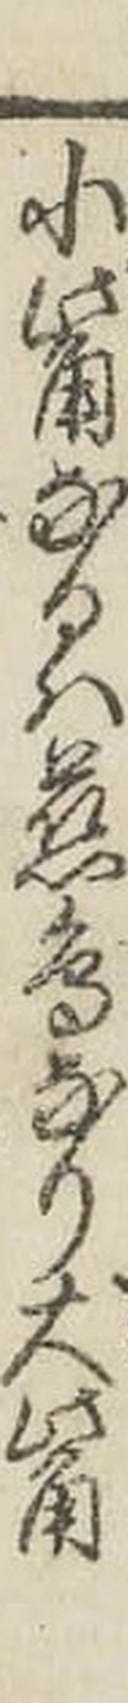小觜なるは慈烏なり大觜
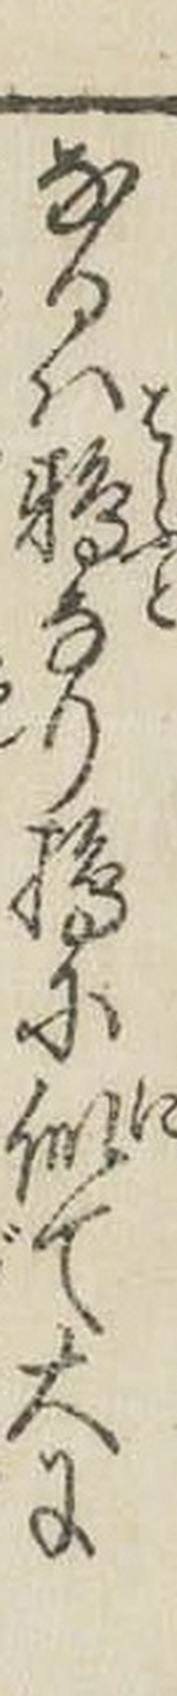なるは鴉なり樢に似て大に
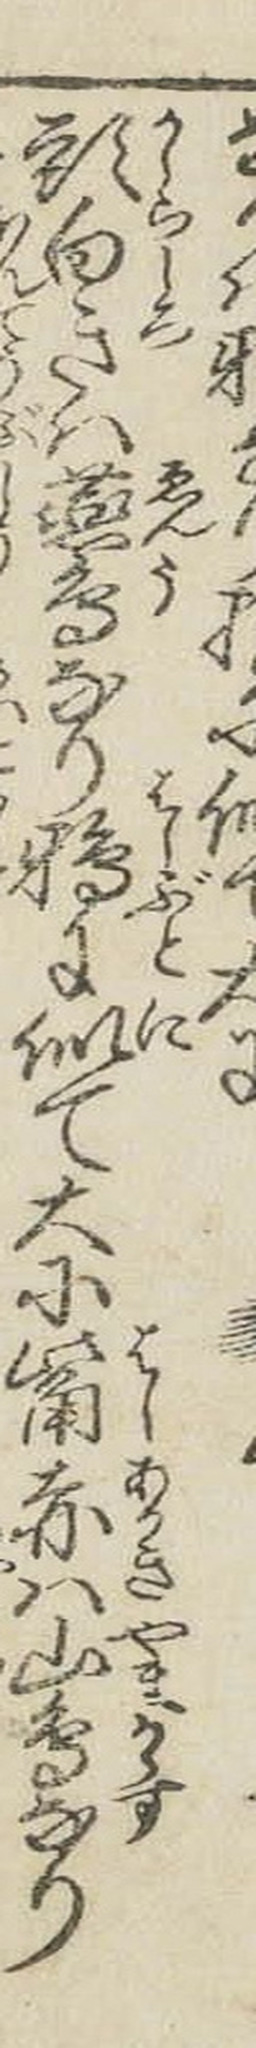頭白きは燕烏なり鴉に似て大に觜赤は山烏なり
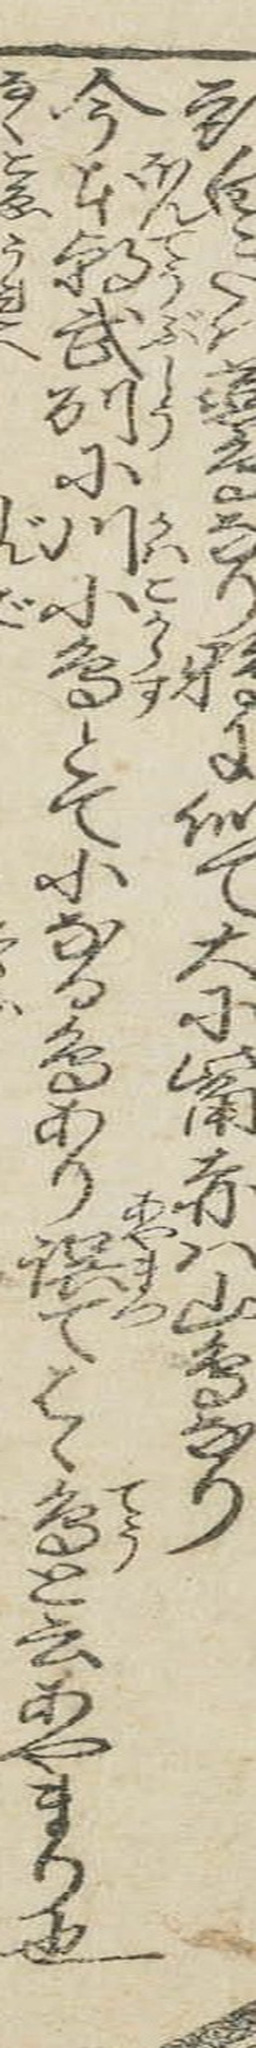今本朝武州に川小烏とて小なる烏あり誤てはゝ鳥と云あやまり也
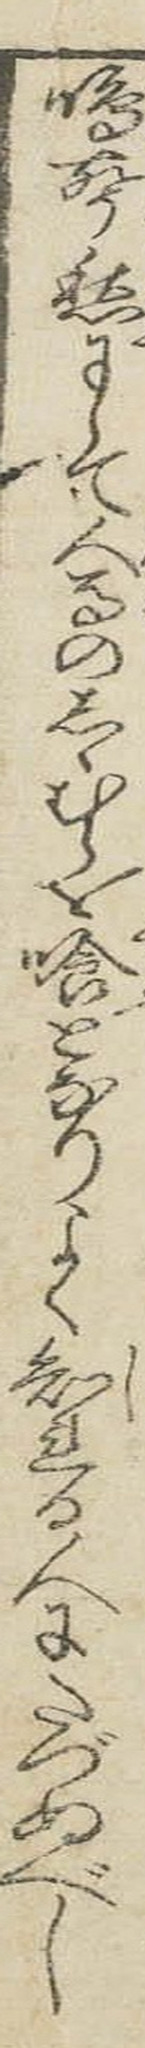鳴声愁にして人馬のしゝむらを喰となりよく知れる人にたづぬべし
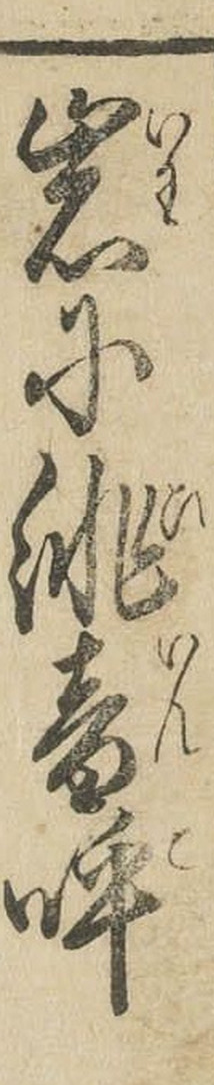岩に緋音呼
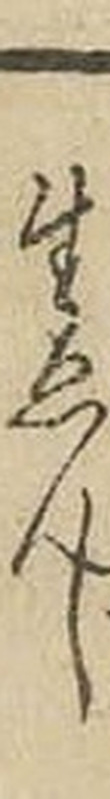生ゑんじ
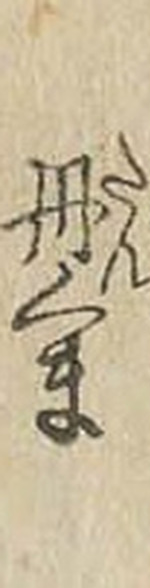丹くま
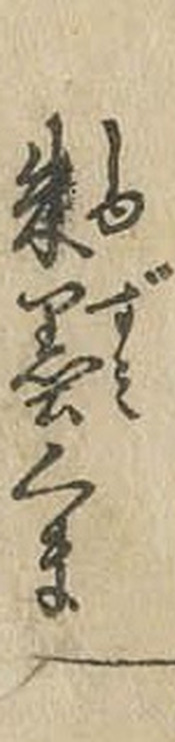朱墨くま
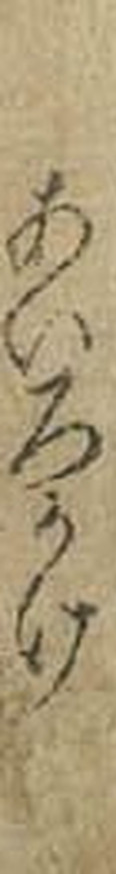あいろかけ
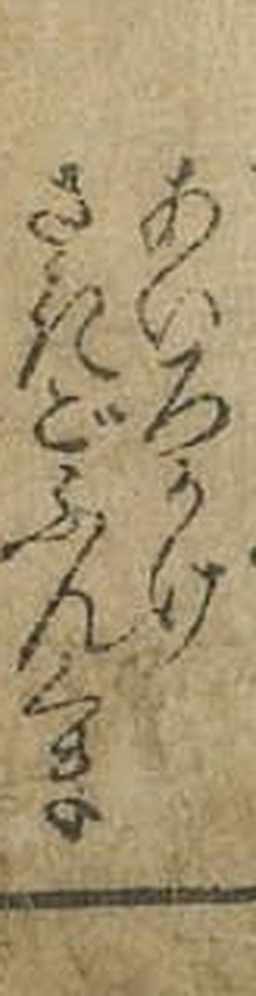さきごふんくま

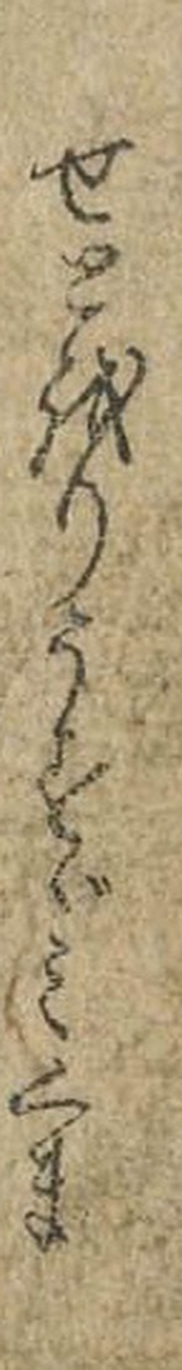せとをりうすゞみくま
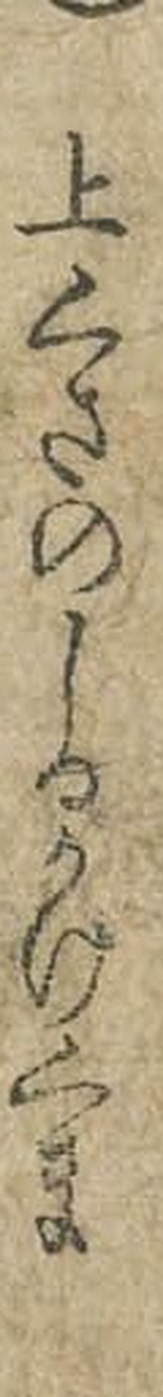上くさのしるかけくま
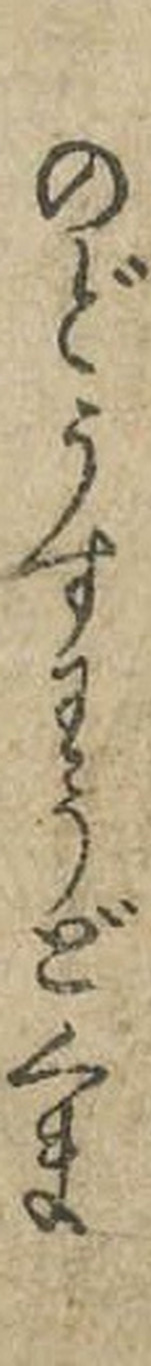のどうすわうどくま
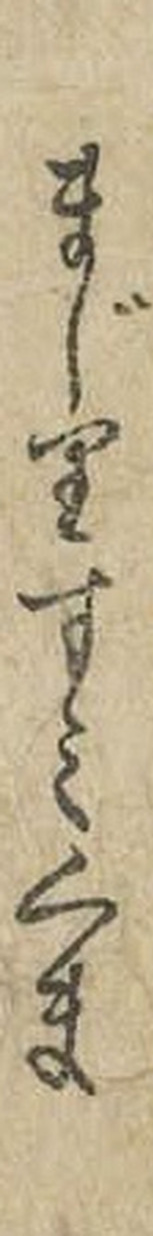まじりすみくま
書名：絵本写宝袋 9巻 8之巻
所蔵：東京学芸大学教育コンテンツアーカイブ
